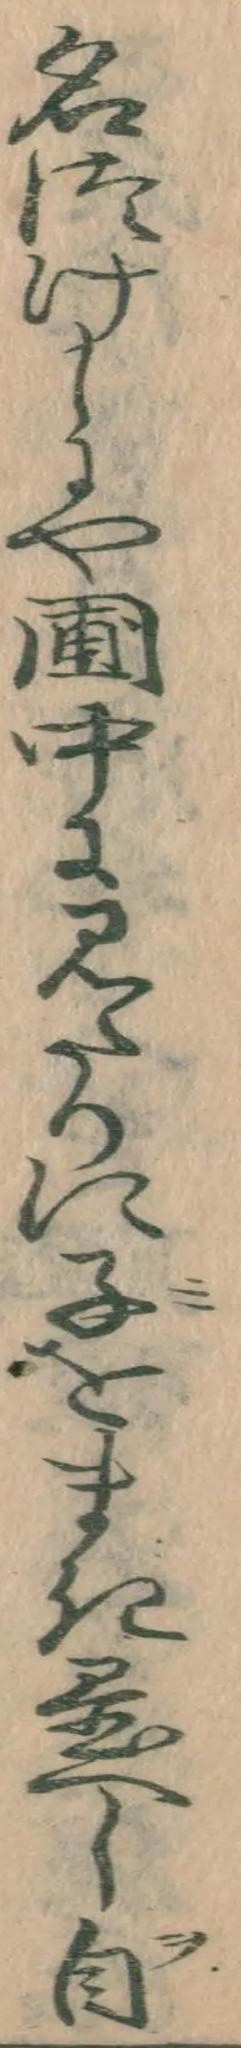名つけしにや圃中にみたりに子をまき置くへし自
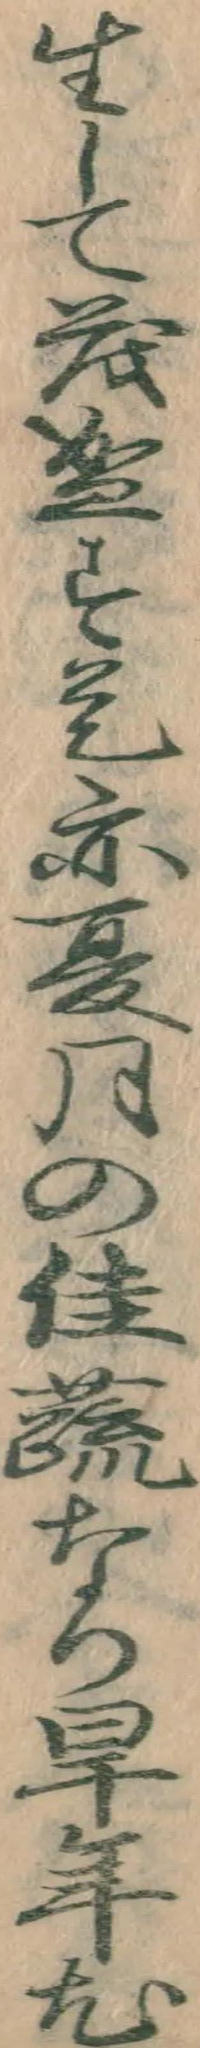生して茂盛す是亦夏月の佳蔬なり旱年尤
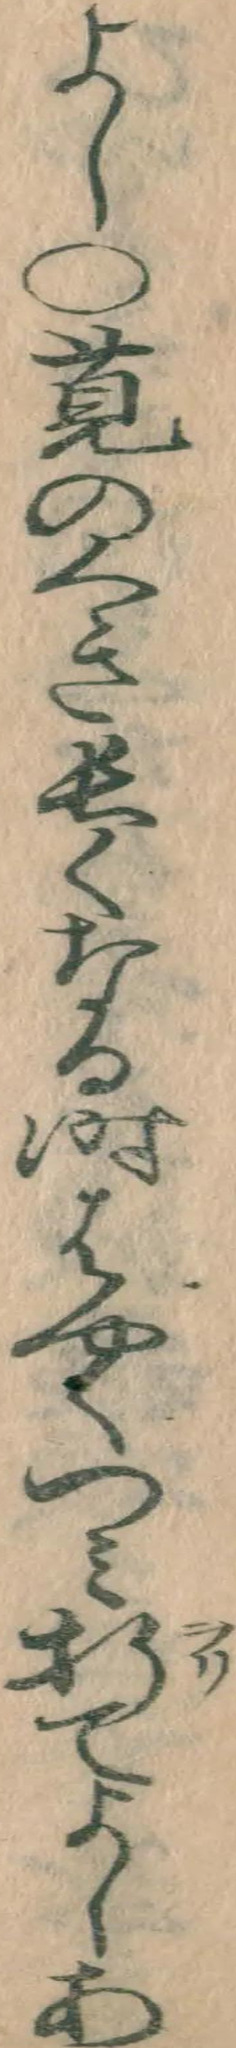よし〇莧のくき長くなる時はやくつみ折てよしあ
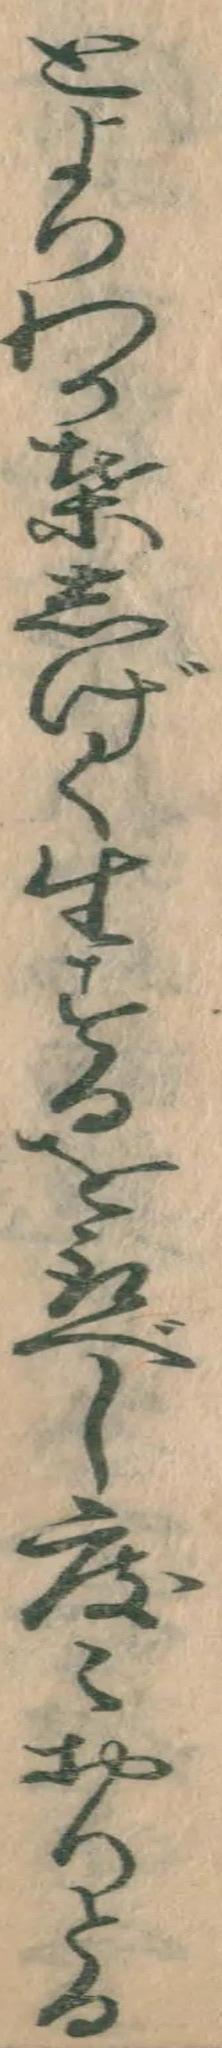とよりわか葉しげく生するを取べし度々おりとる

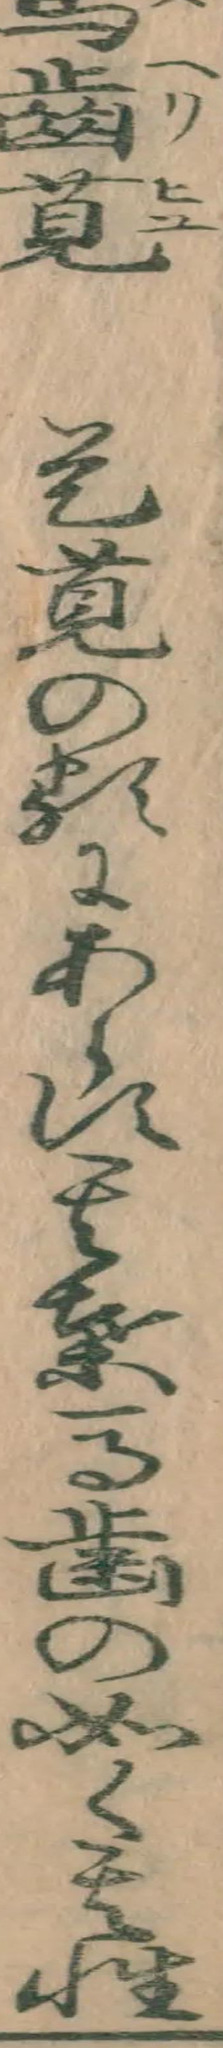馬歯莧是莧の類にあらす其葉馬歯の如く其性
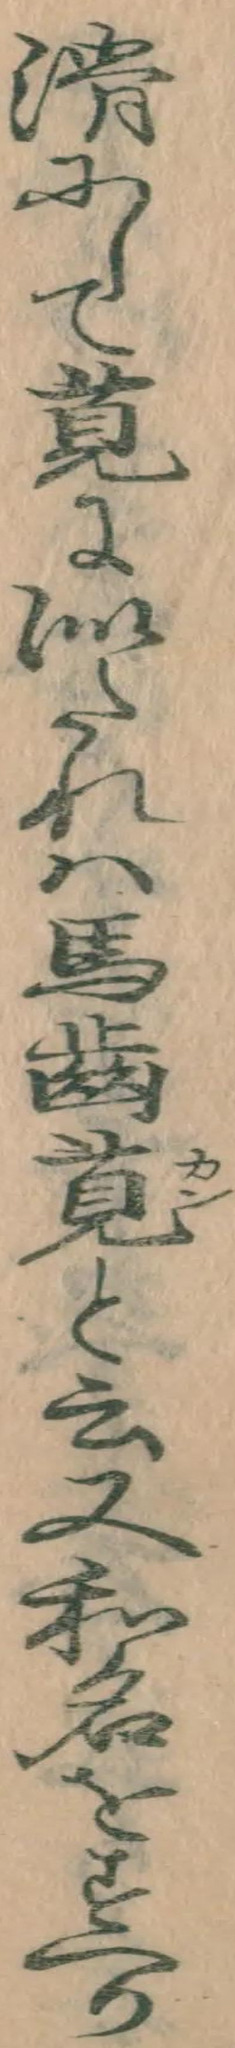滑にして莧に似たれは馬歯莧と云又和名をすへり
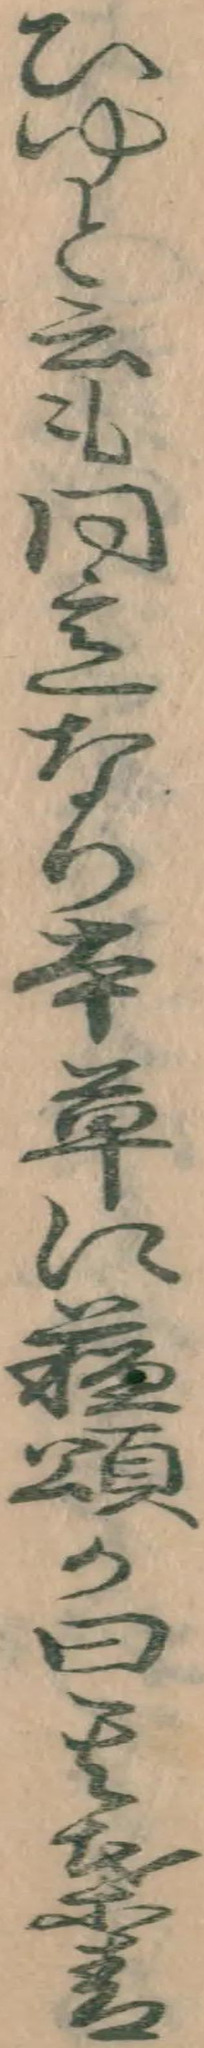ひゆと云も同意なり本草に蘇頌か白其葉青
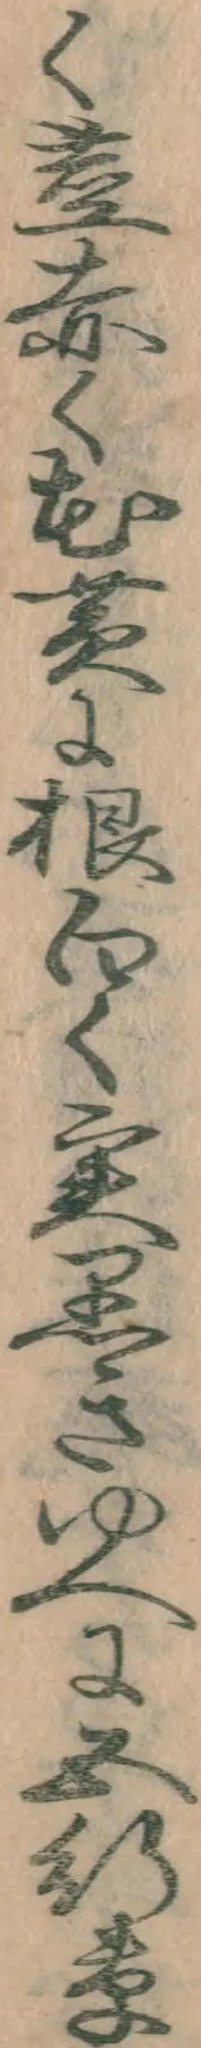く茎赤く花黄に根白く実黒きゆへに五行草
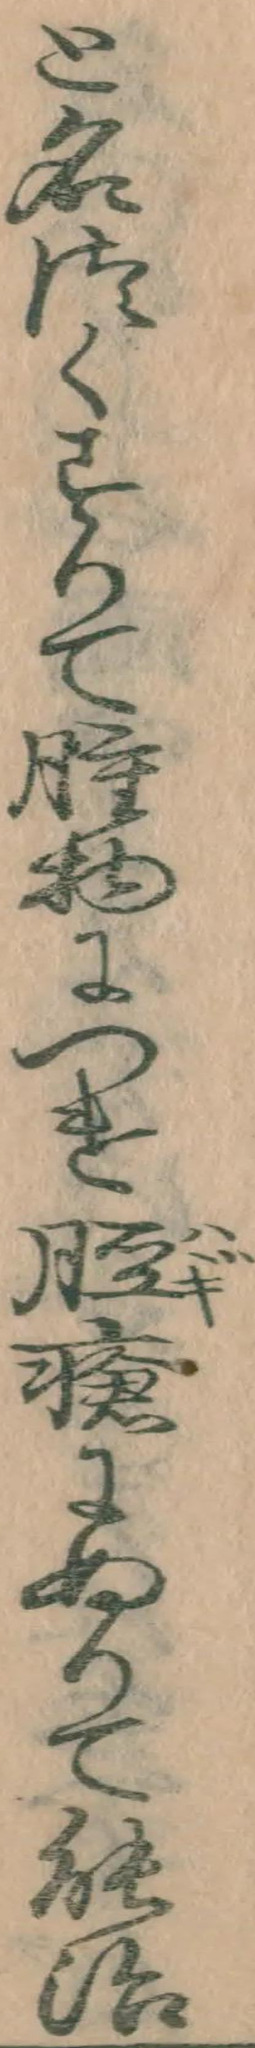と名つくすりて腫物につけ脛瘡にぬりて能治
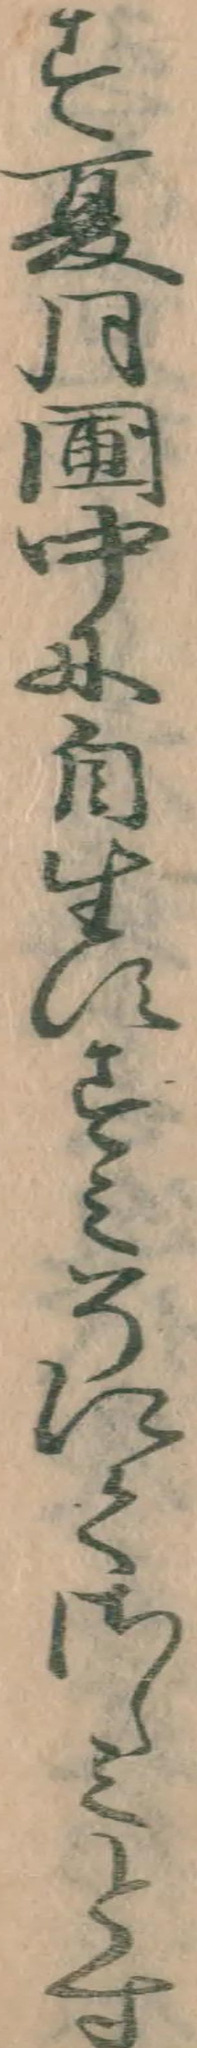す夏月圃中に自生すすみそにてさしみとす
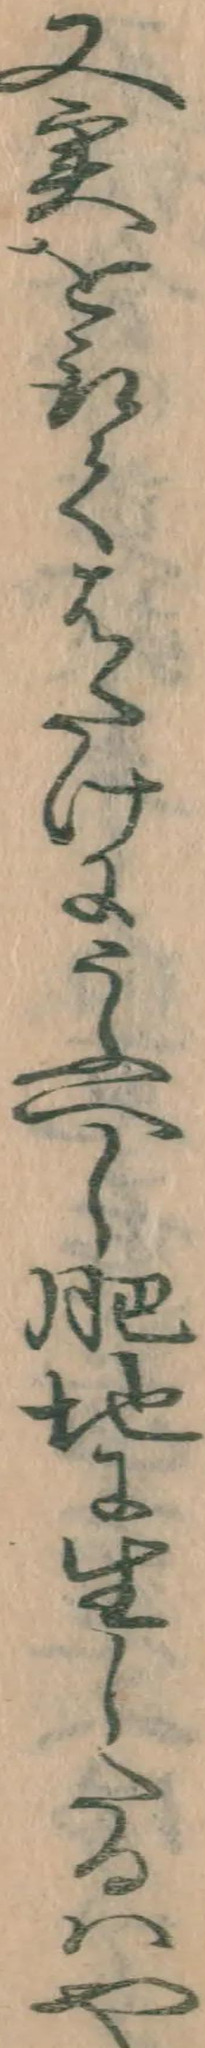又実を取てはたけにうふへし肥地に生したるはや
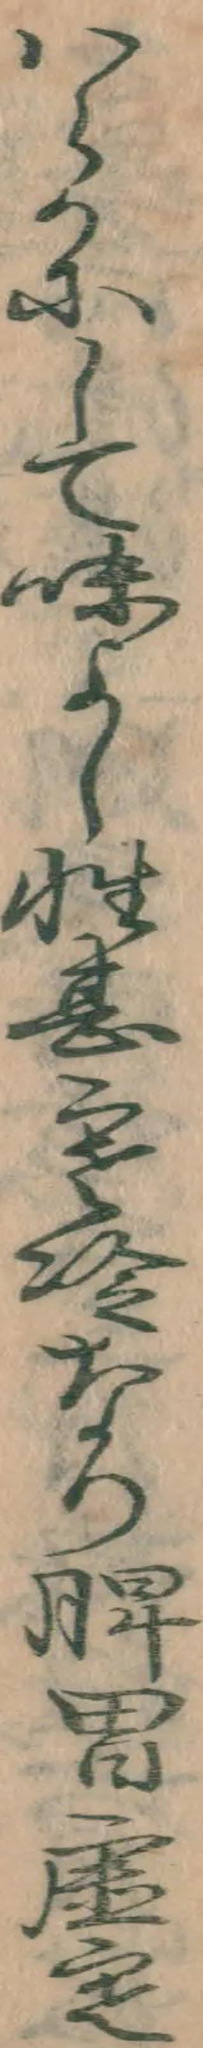はらかにして味よし性甚寒冷なり脾胃虚寒
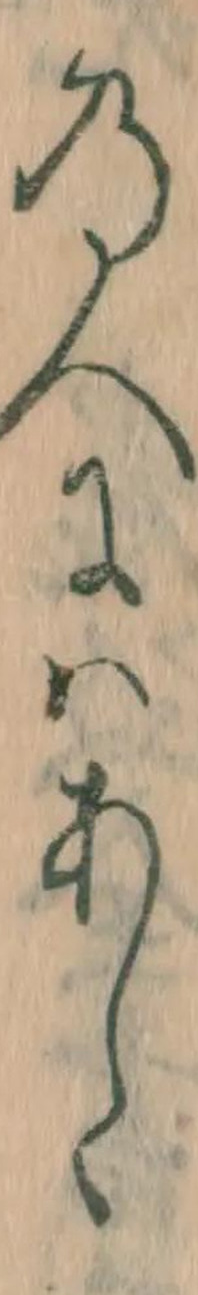の人にはあしゝ
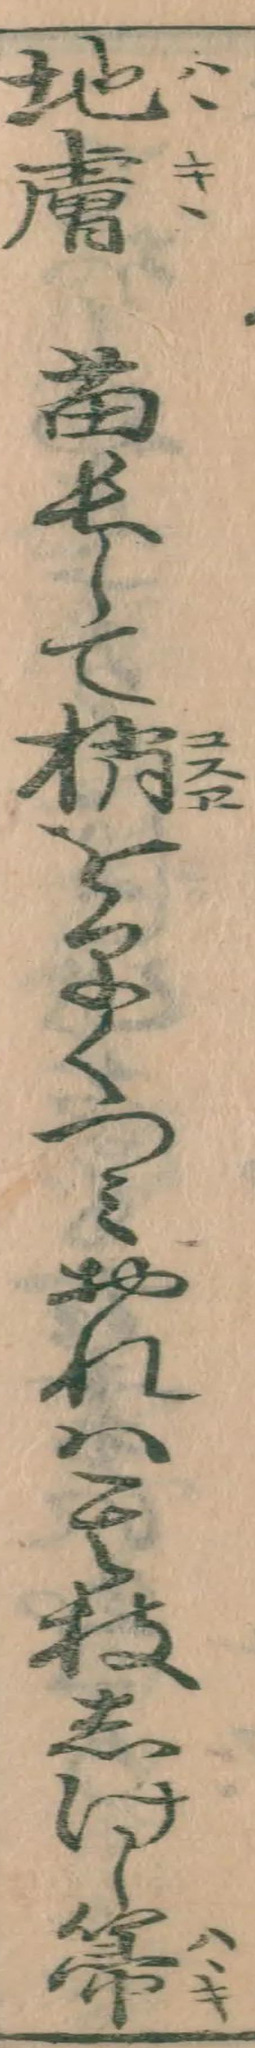地膚苗長して梢を早くつみおれは其枝しはし箒
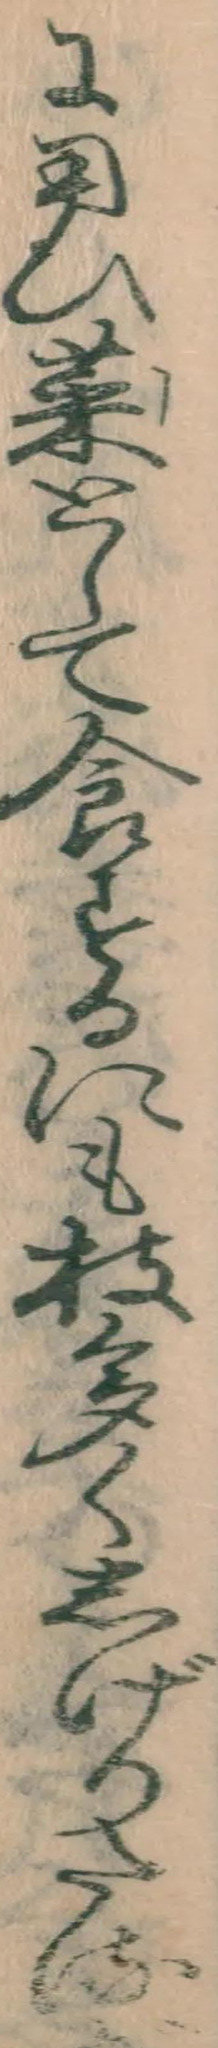に用ひ菜として食するにも枝多くしげりたるが
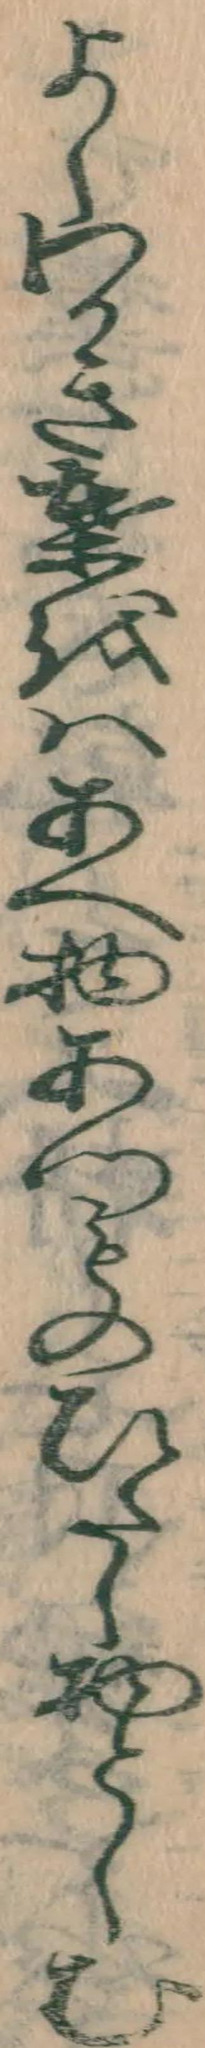よしわかき葉をはあへ物あつものひたし物としむ
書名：菜譜 3巻
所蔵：国立国会図書館 National Diet Library, JAPAN
